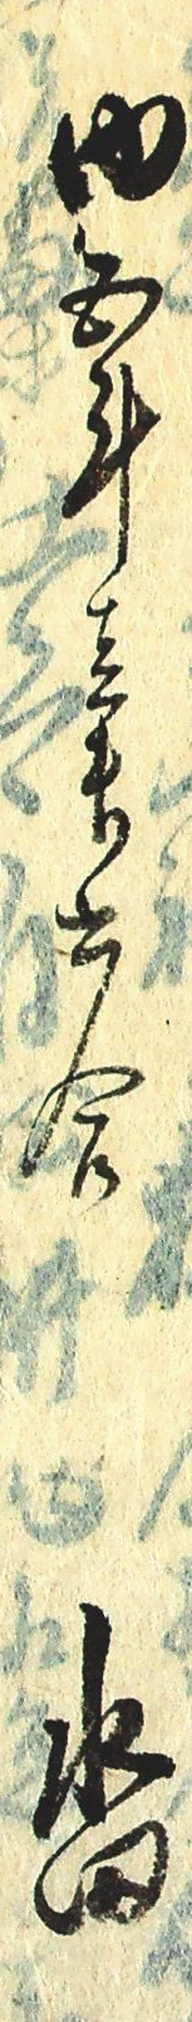内五斗壱升六合水田
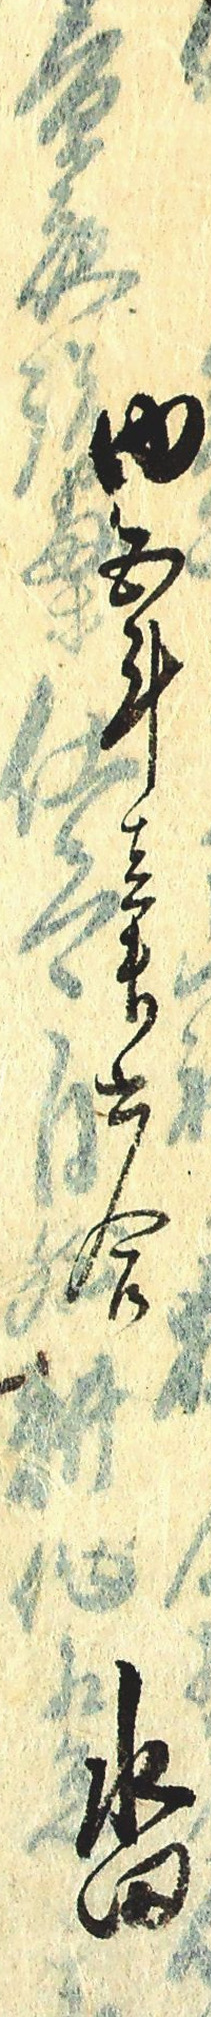内五斗壱升六合水田

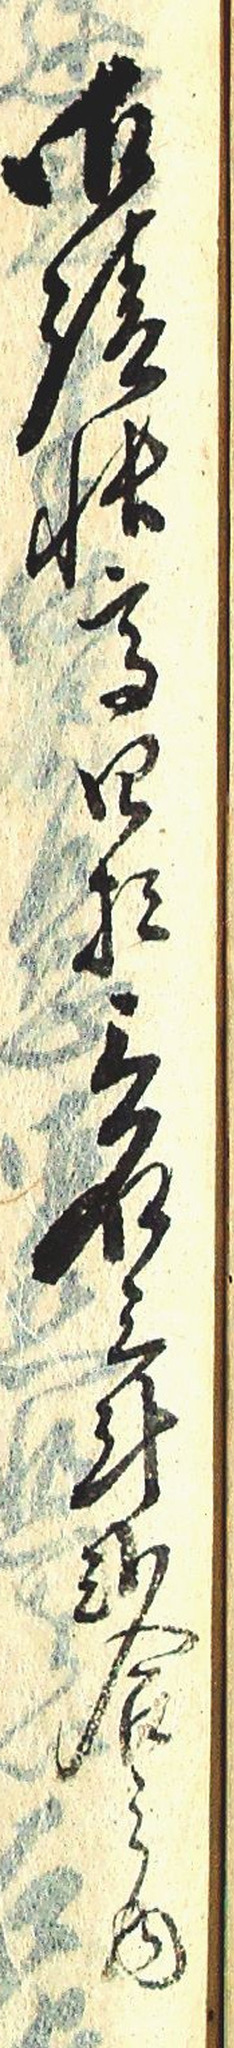御請帳高四拾三石三斗弐合之内
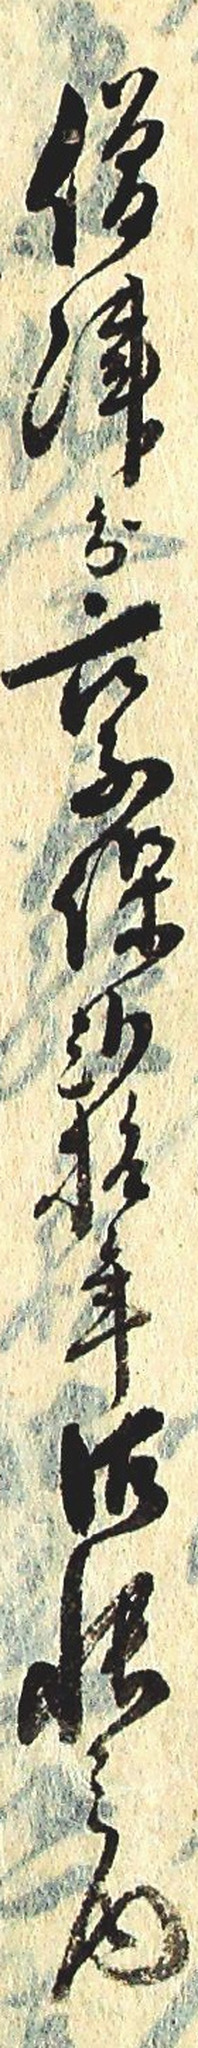僧津分享保弐拾年御帳之内
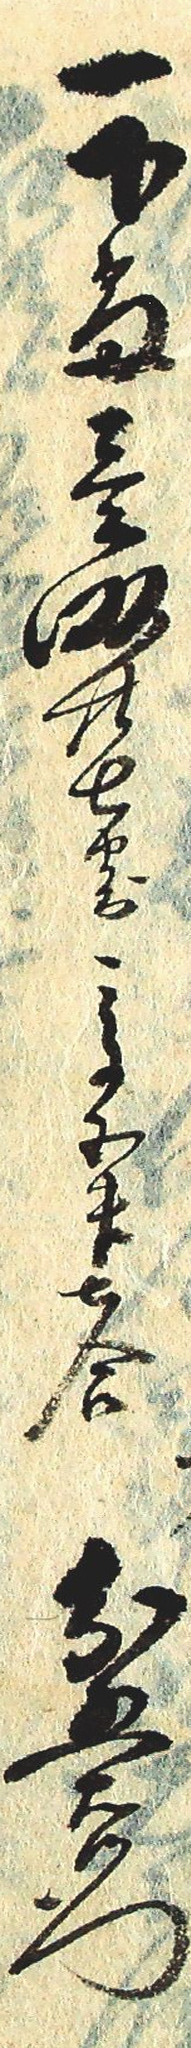一下畠壱畝廿七歩高五升七合分五右衛門
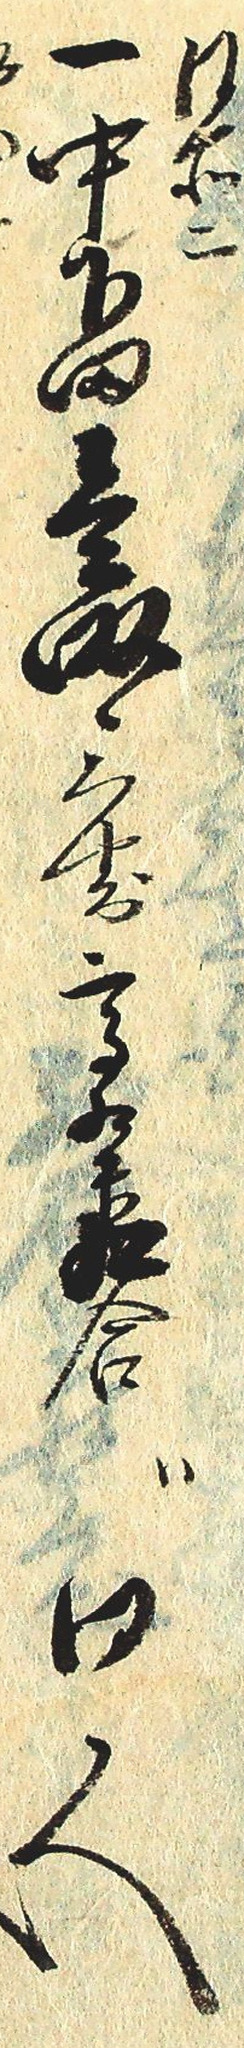一中下田壱畝三歩高九升九合同人
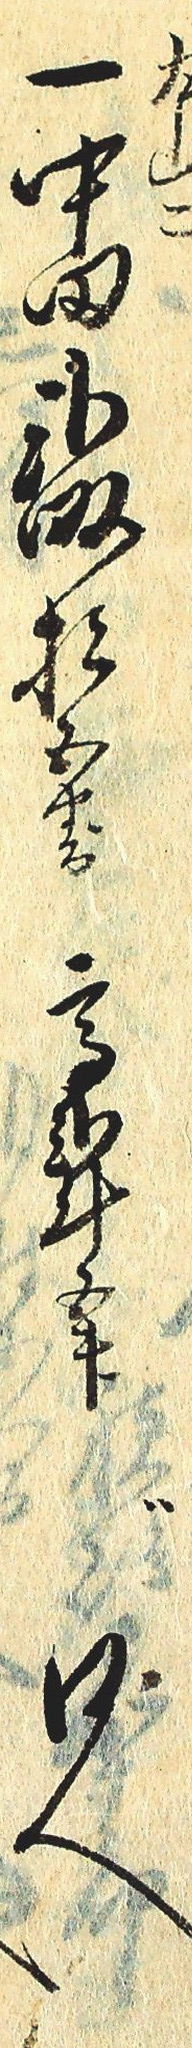一中田弐畝拾五歩高弐斗五升同人
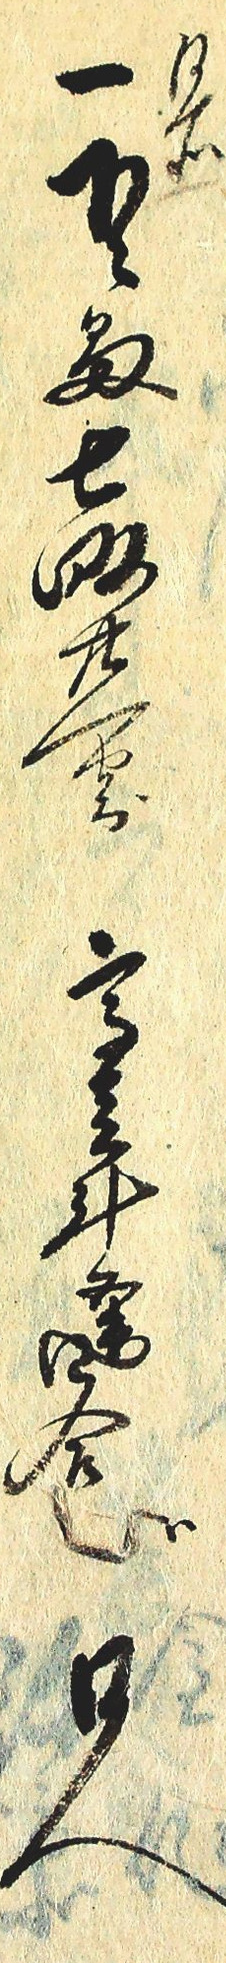一下々畠七畝廿一歩高壱斗五升四合同人
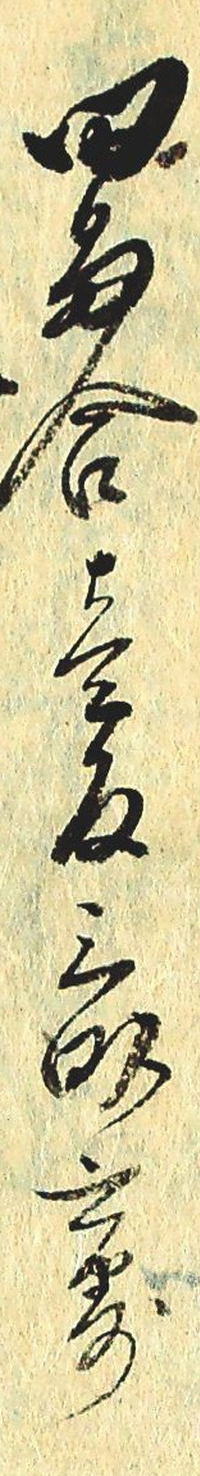田畠合壱反三畝六歩
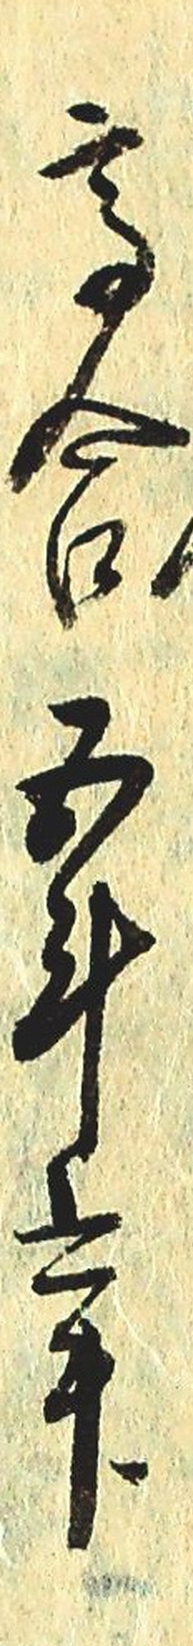高合五斗六升
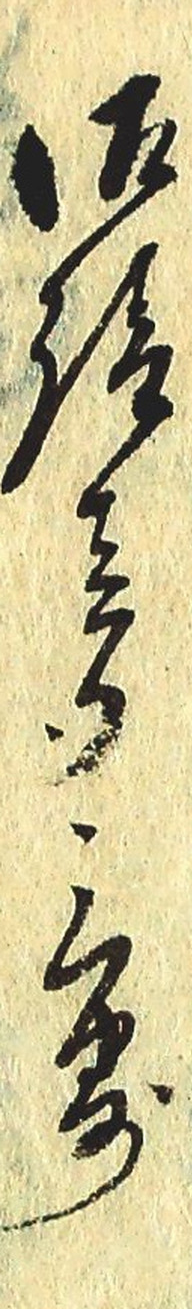御請壱つ三歩
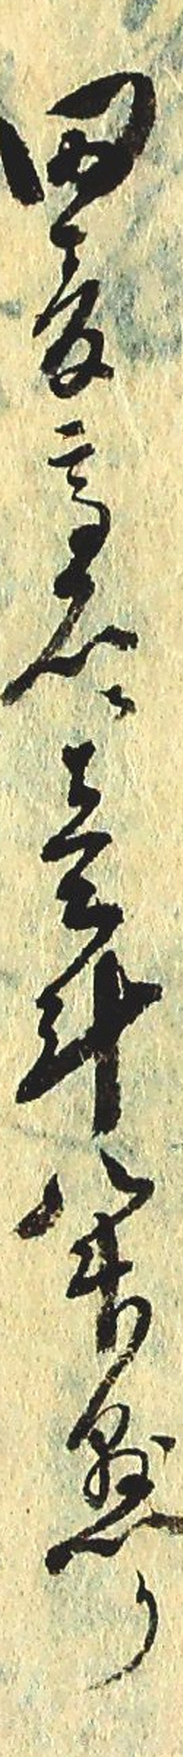田麦高石に壱斗八升懸り
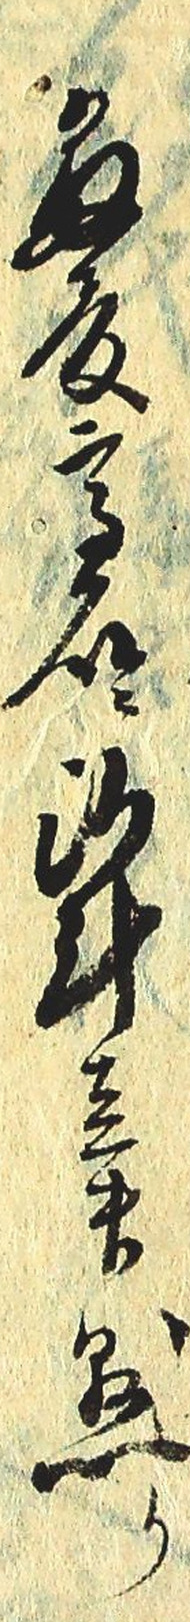畠麦高石に弐斗壱升懸り
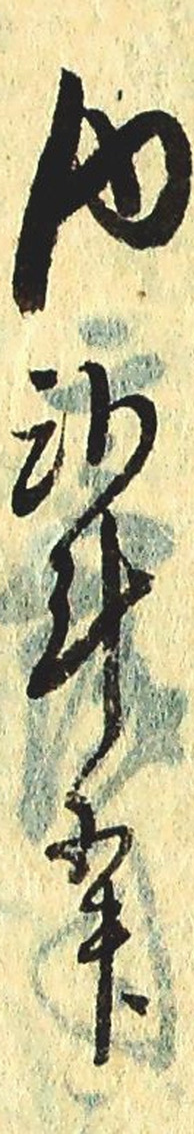内弐斗五升
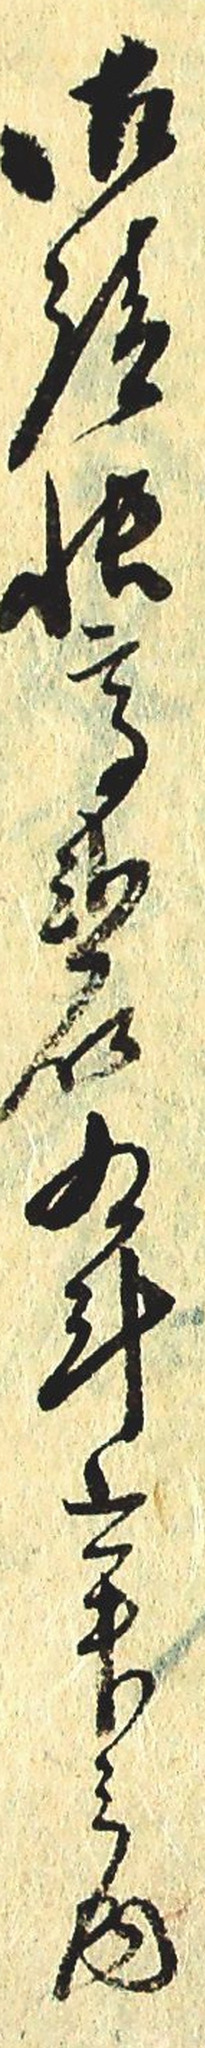御請帳高弐石九斗六升之内
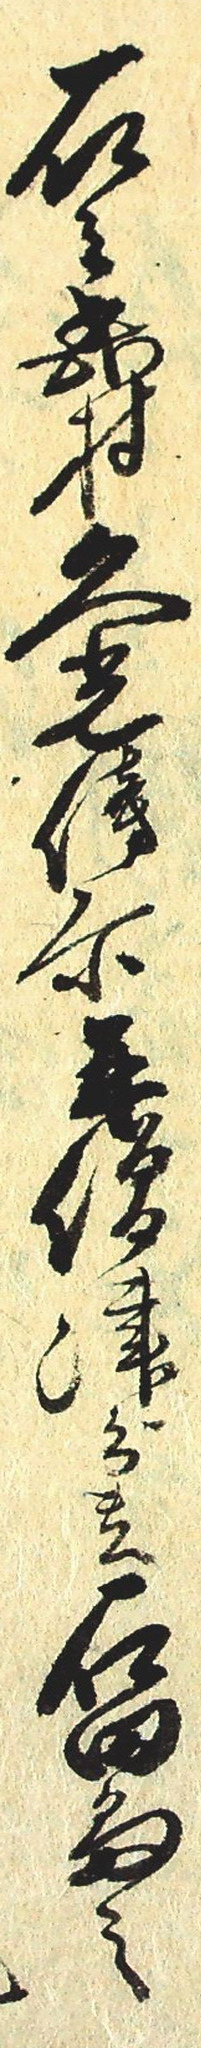右之当村久光傍示并僧津分共右田畠之
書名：諸御願書控(弐番）
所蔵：鳴門教育大学 Naruto University of Education
